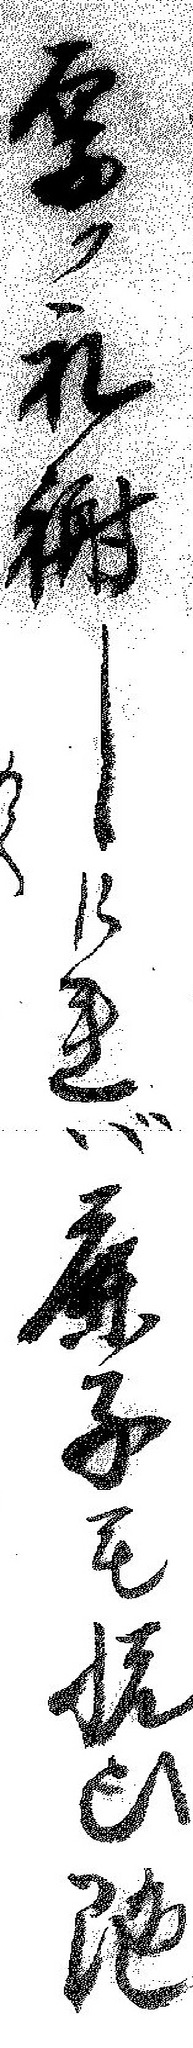厚く礼謝しければ鹿子も悦ひ随
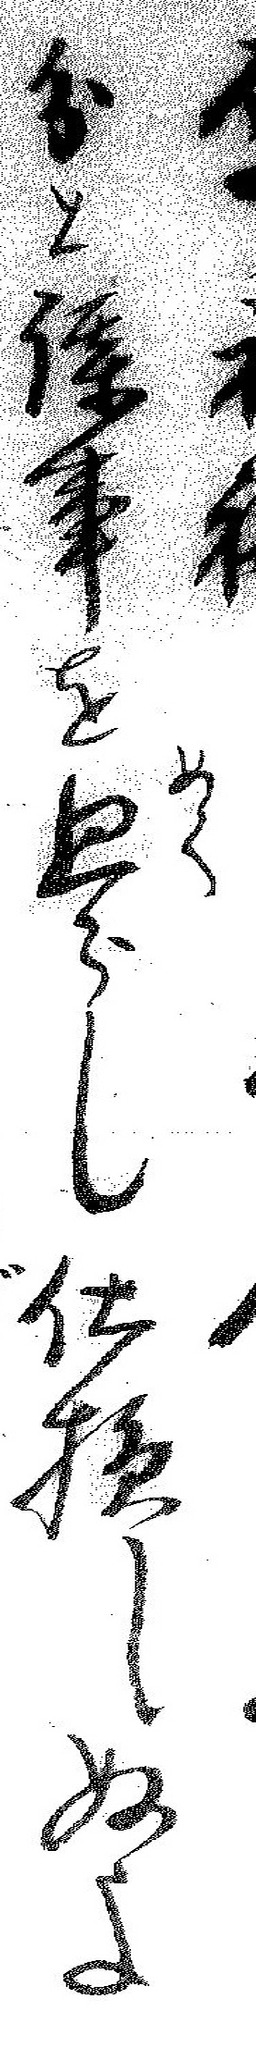分と謀事を廻らし仕損しぬよ
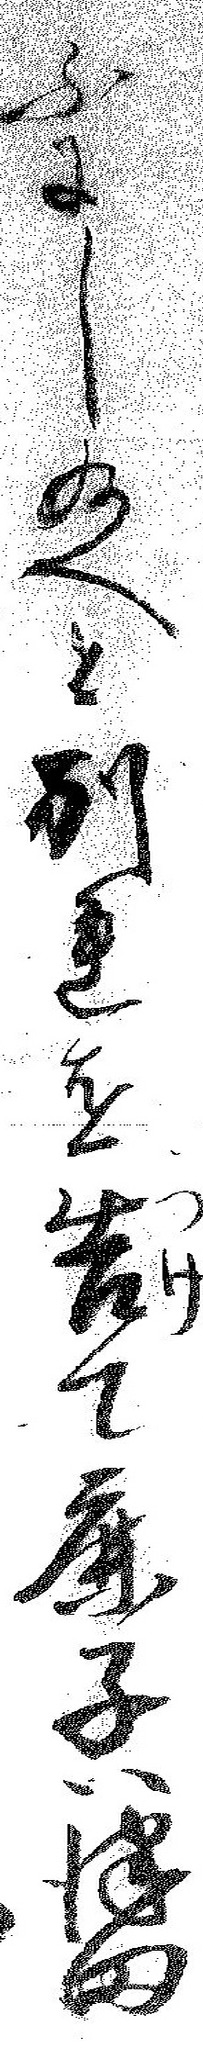ふにし給へと別れを告て鹿子は津田
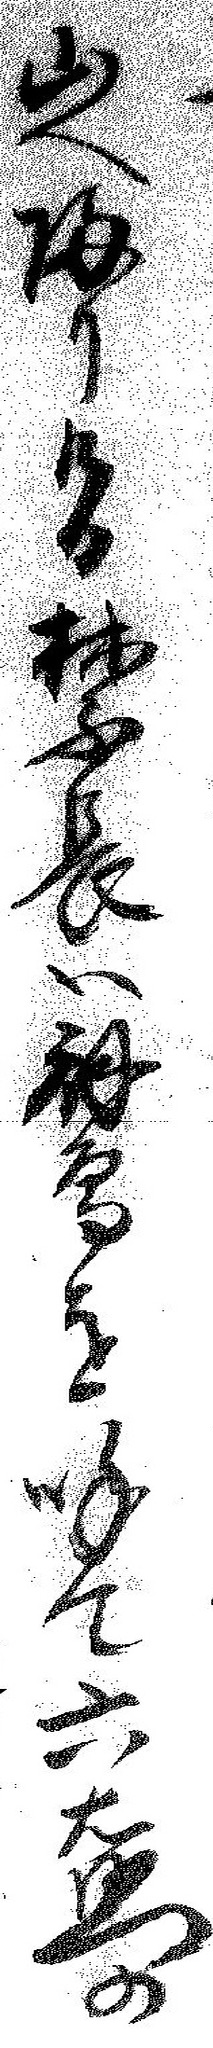山へ帰りける禁長は鷹を呼て六右衛門の
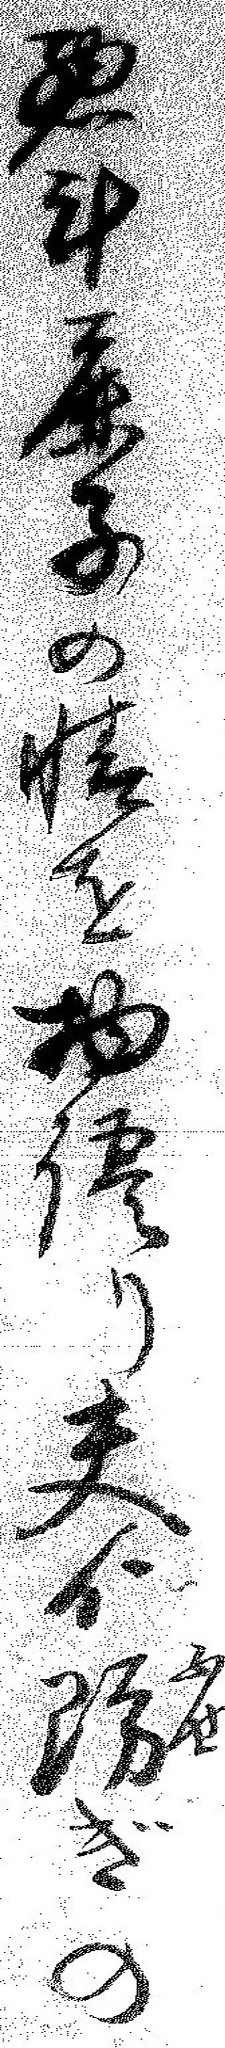悪計鹿子の情を物語り夫より防ぎの

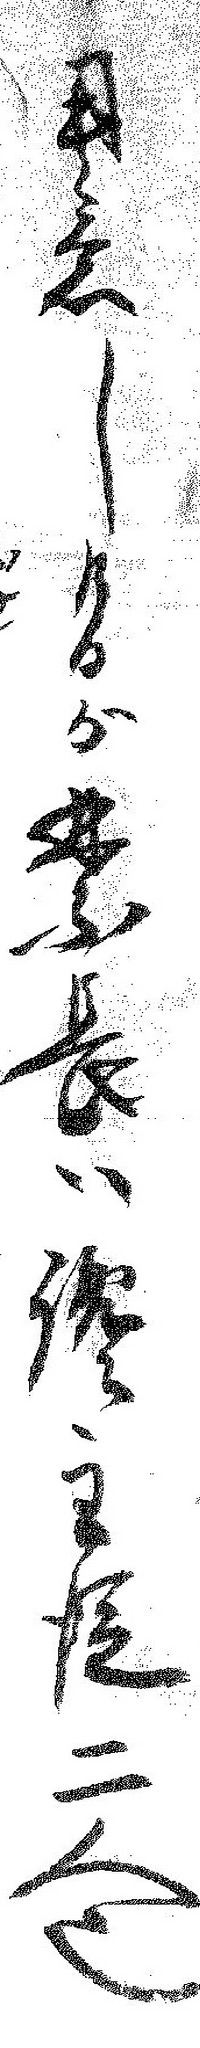用意しけるが禁長は纔主従二人也
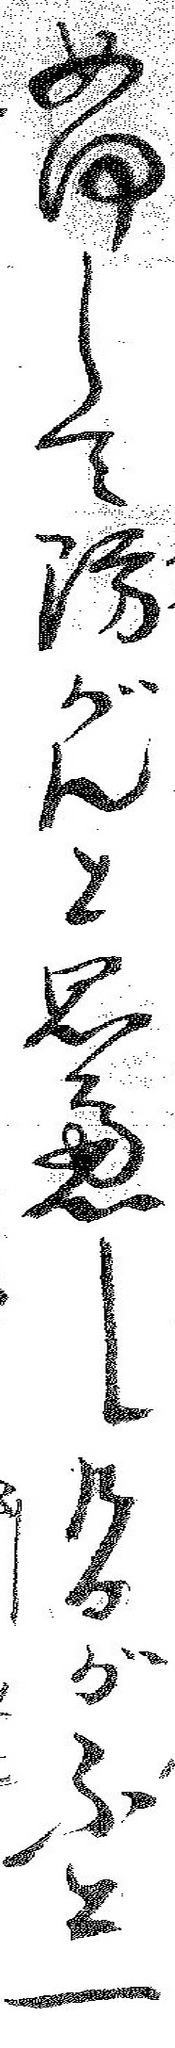如何して防がんと思慮しけるがふと一
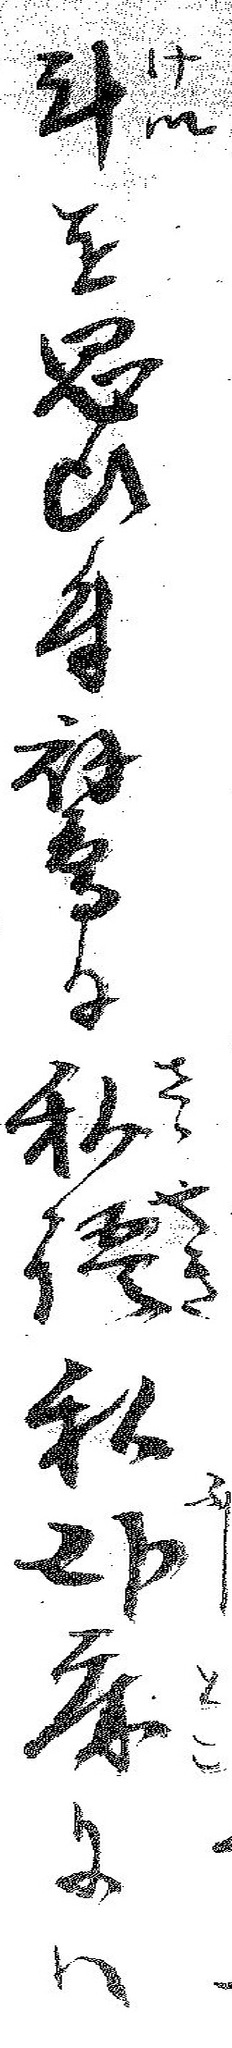計を思ひ付鷹に私語臥床には
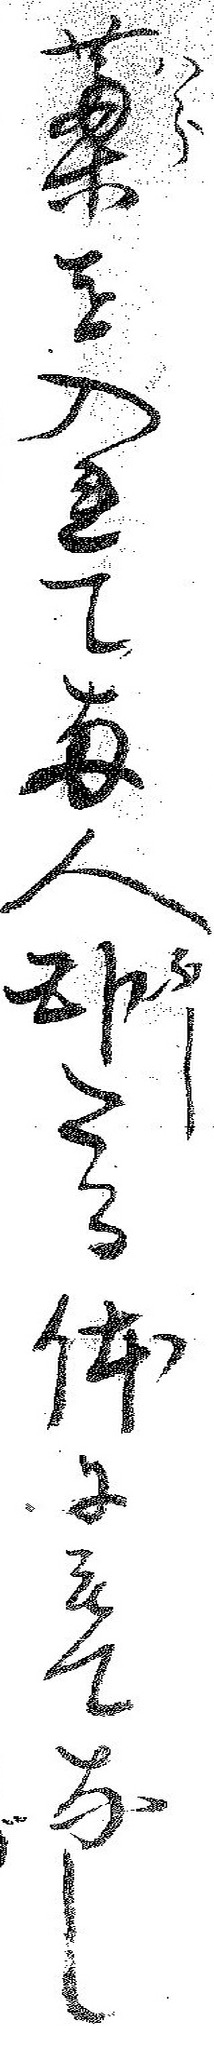藁を入れて両人臥たる体にもてなし
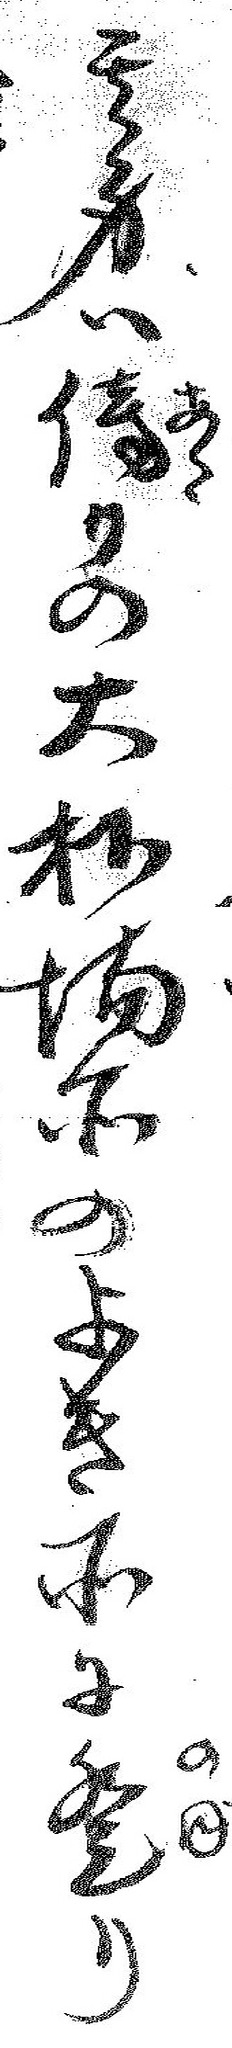其身は傍りの大杉場所のよき所に登り
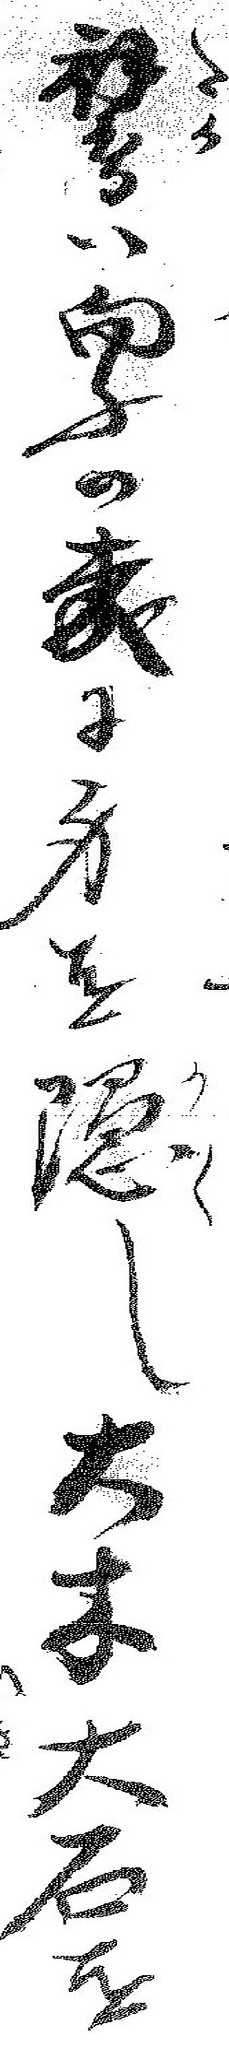鷹は向ふの森に身を隠し大木大石を
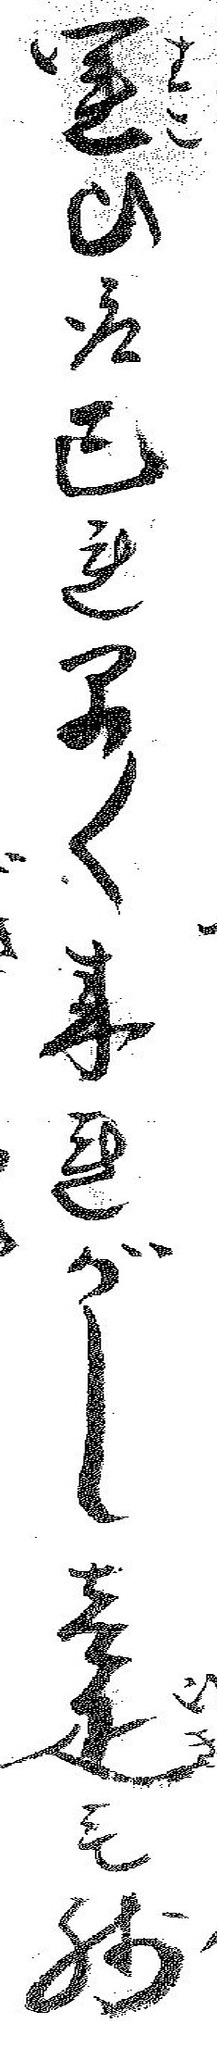運ひ取己れ早く来れがし一疋も残
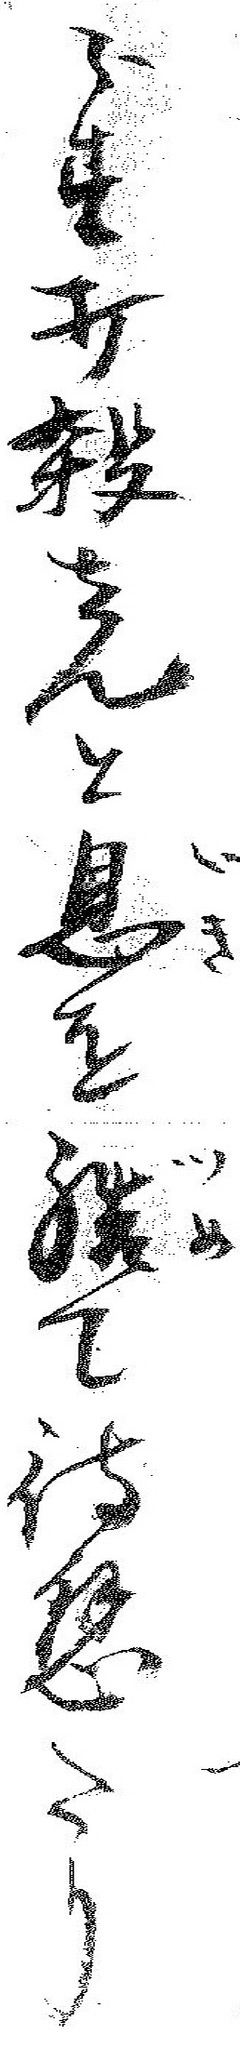らす打殺さんと息を詰て待懸たり
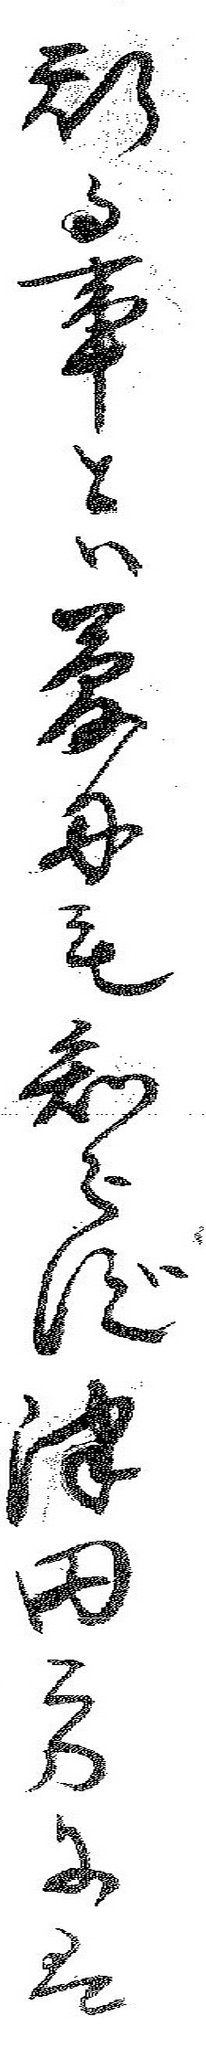斯る事とは夢にもしらず津田方には
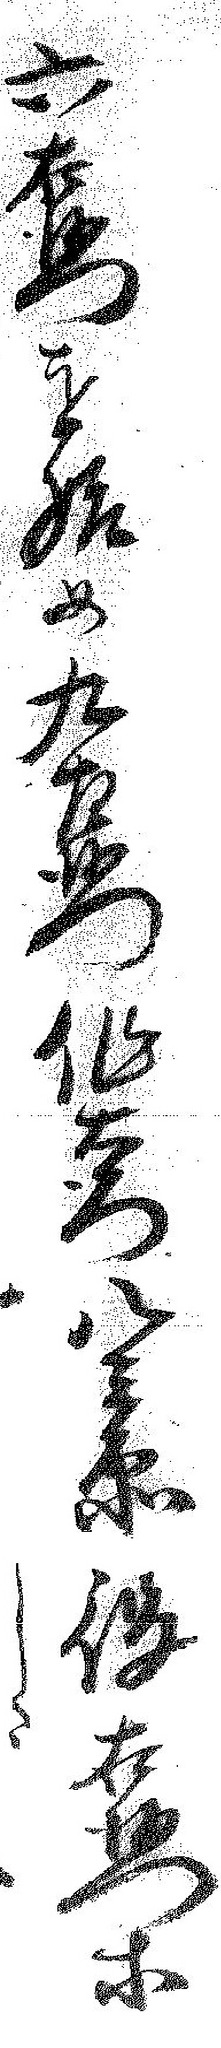六右衛門を始め九左衛門作右衛門八兵衛役右衛門等
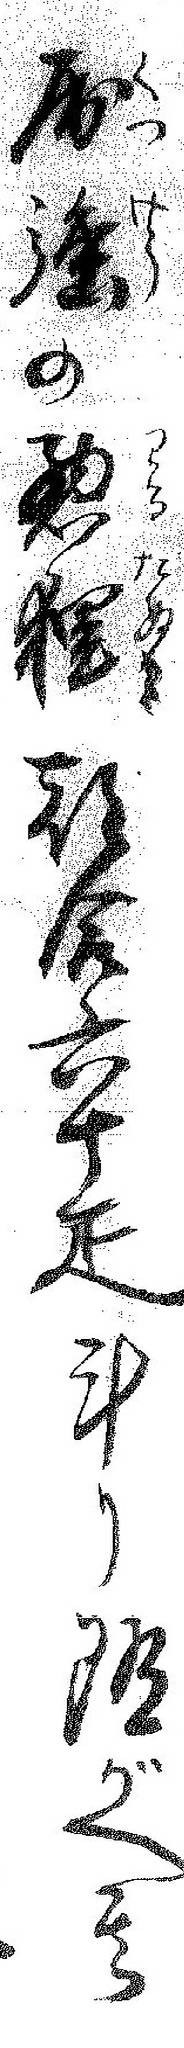屈強の悪狸都合六十疋斗り随がへ其
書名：近頃古狸珍説　礼義智信
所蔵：徳島県立図書館
